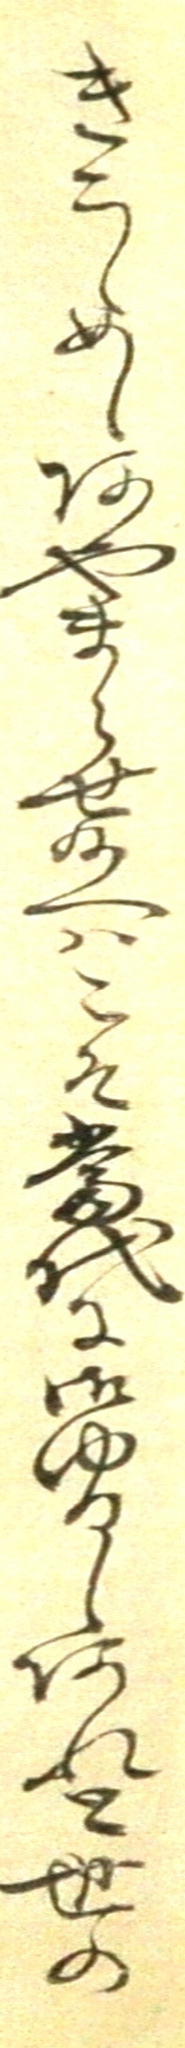きこしめしあやまらせ給へはこそ当代に御ゆるしあれと世の
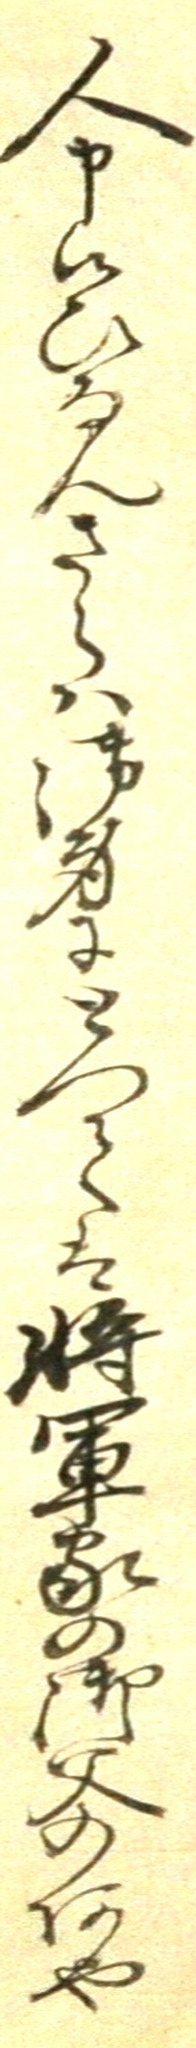人申候ひなんさらは御身にとつては将軍家の御父のあや
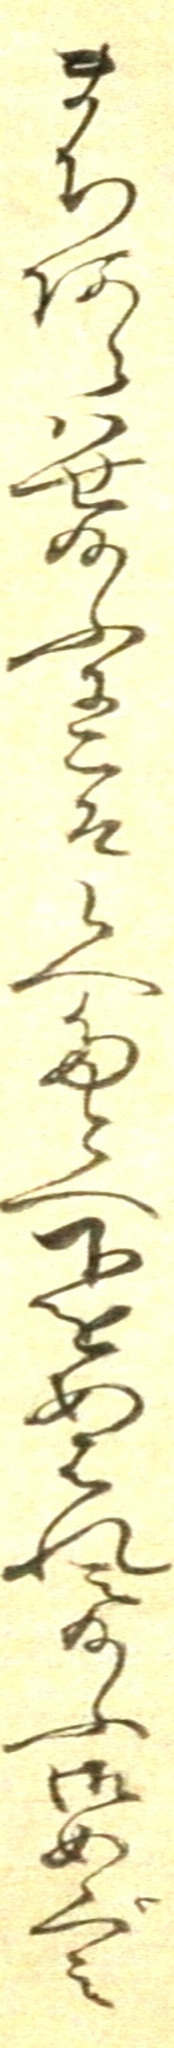まちあらはせ給ふにこそ候へたとへ下をあはれみ給ふ御めぐみ
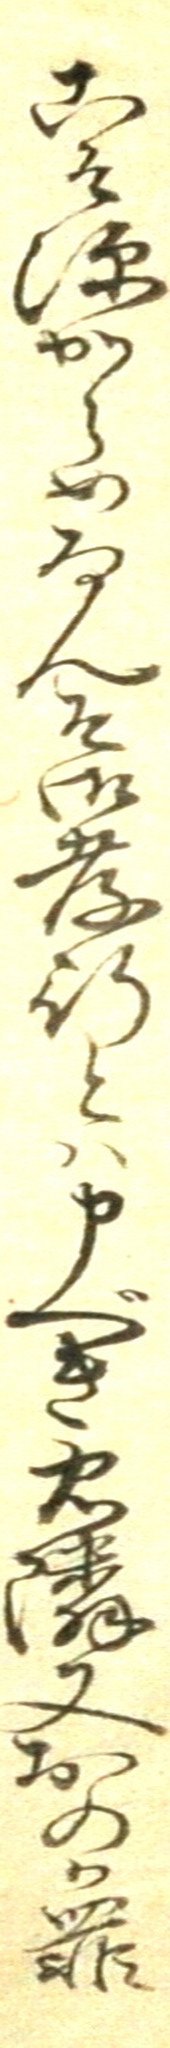こそ深からめなんそ御孝行とは申べき忠隣又おのか罪
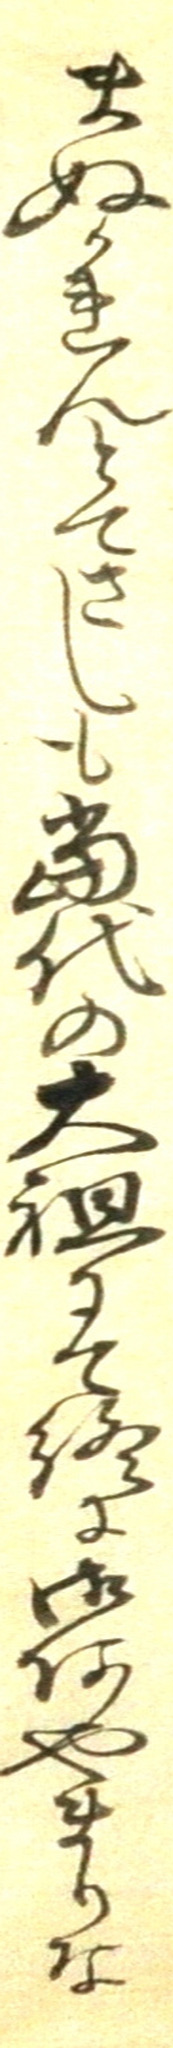まぬかれんとてさしも当代の大祖にて終に御あやまりな
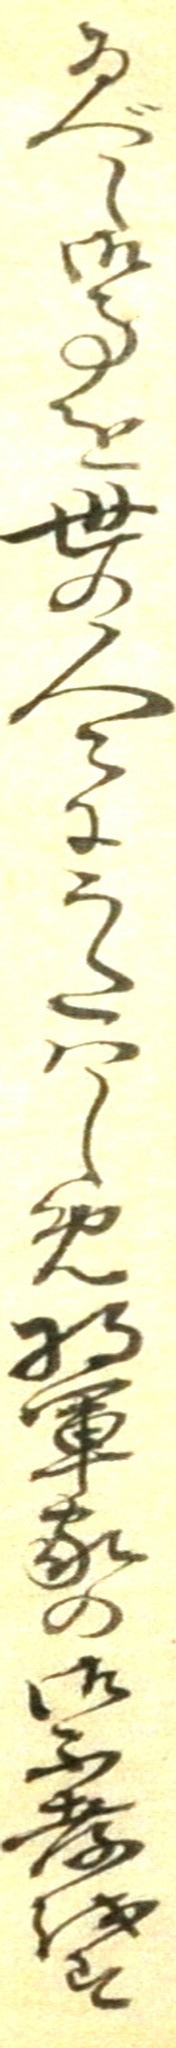るべし御事を世の人々にうたはしめ将軍家の御不孝をそ
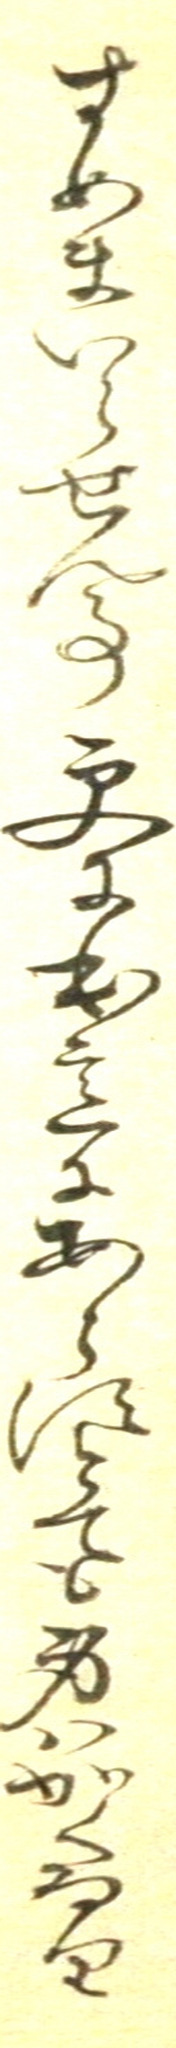すめまいらせん事更に本意にあらすとても身はかくなり
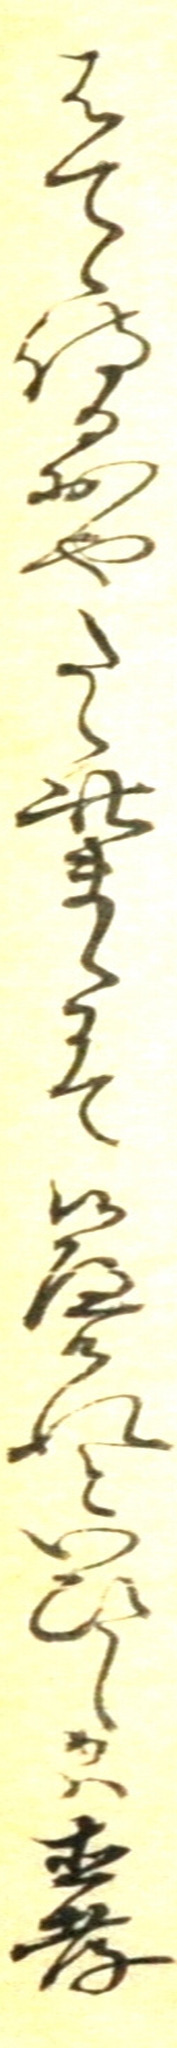はてゝ侍るおやたゝ此まゝにて候へけれといひしかは直孝
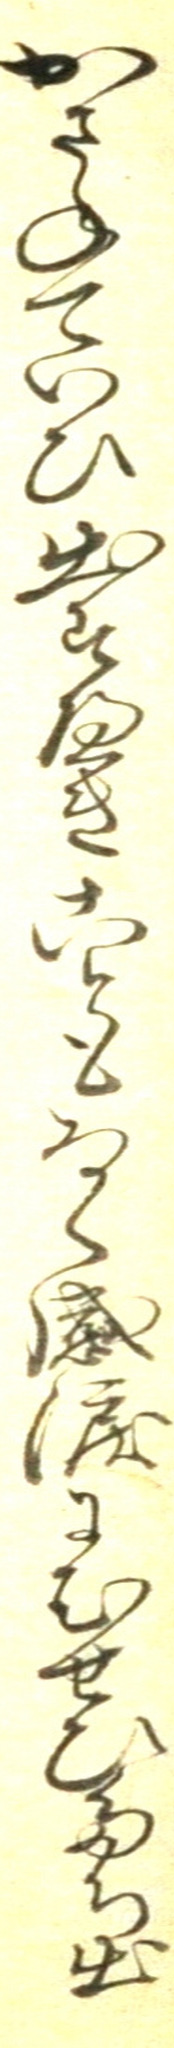かさねていひ出すへきこともなく感涙にむせひたち出
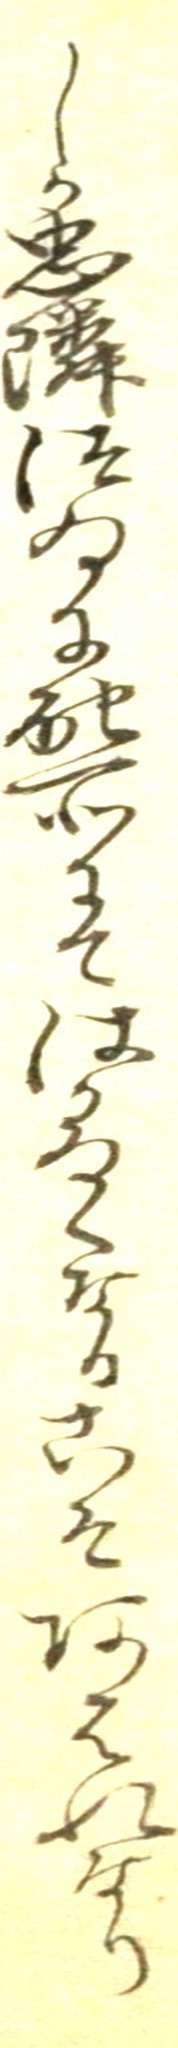しか忠隣つゐに配所にてはかなくなるこそあはれなり
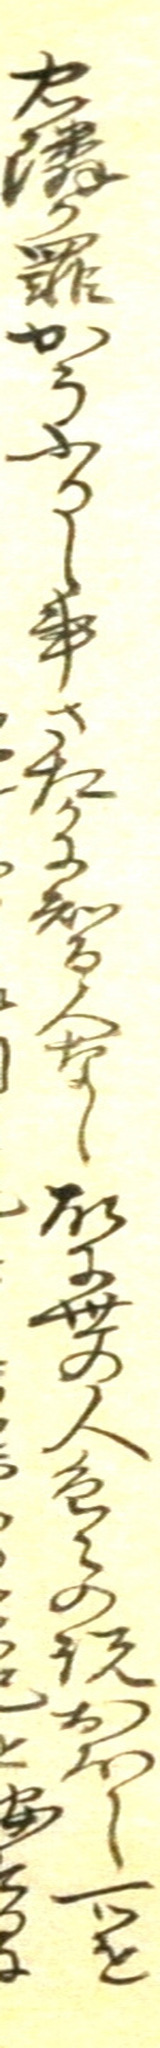忠隣か罪かうふりし事さたかに知る人なし故に世の人色々の節おほし一ツも
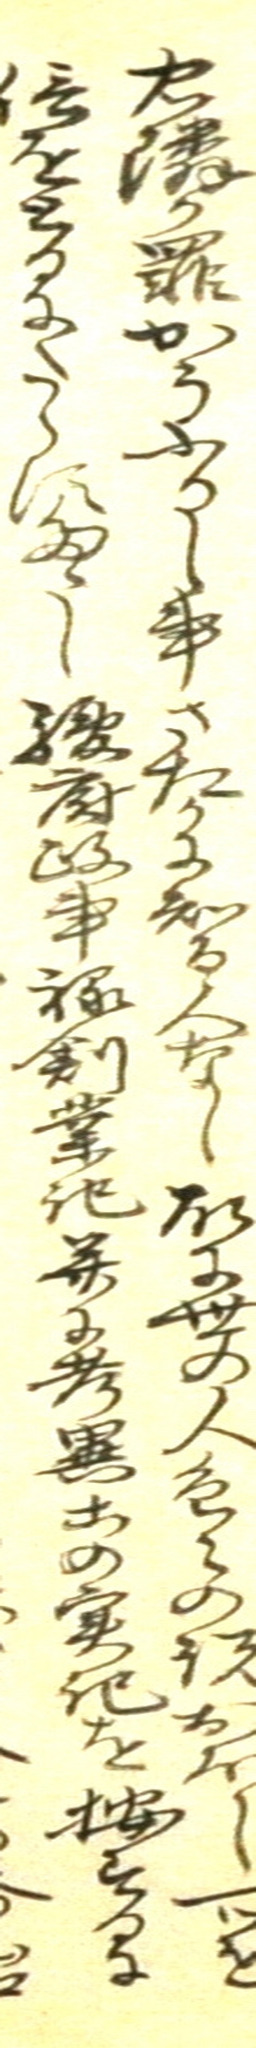信をとるにたらすたゝし駿府政事禄創業記幷に考異等の実記を按するに
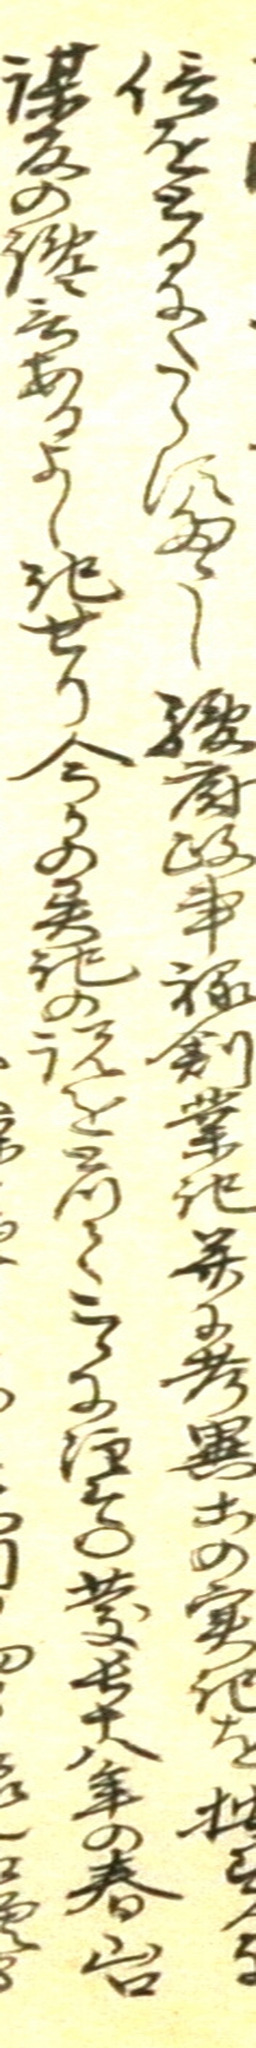謀反の讒言あるよし記せり今かの異記の説をとつてこゝに注す〇慶長十八年の春山口
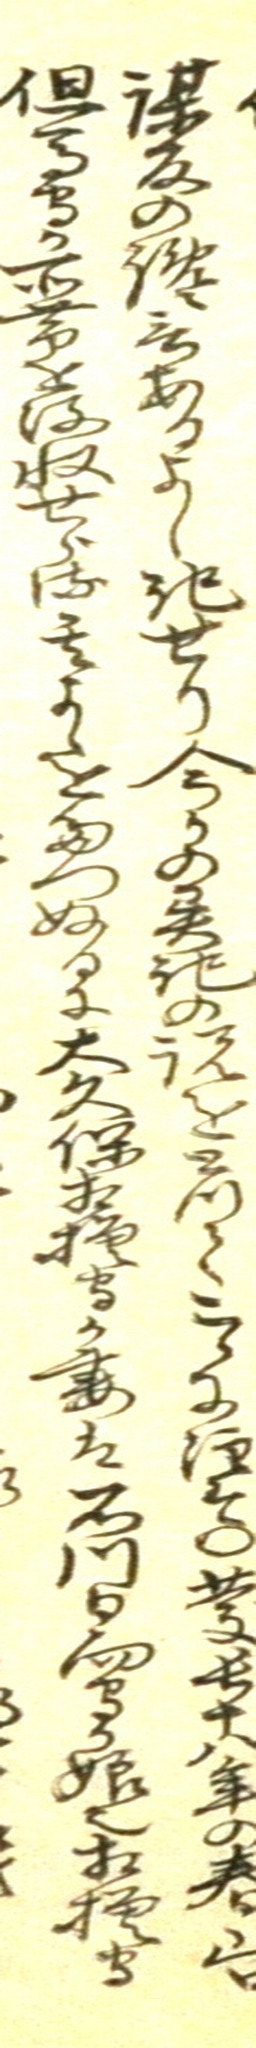但馬守か所帯を没収せらる其よしをたつぬるに大久保相模守か妻は石川日向守か娘也相模守
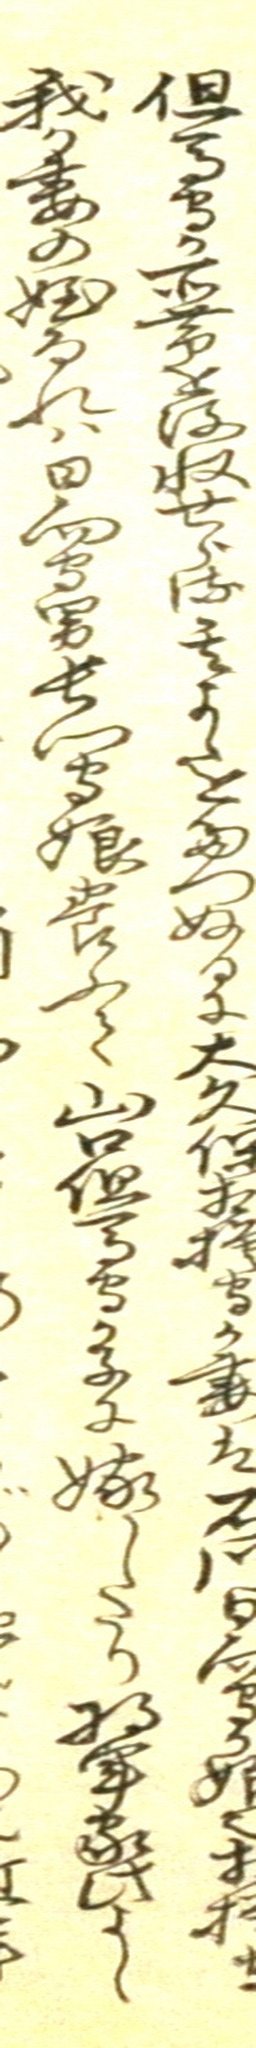我か妻の姪なれは日向守男長門守娘養ふて山口但馬守か子に嫁したり将軍家此よし
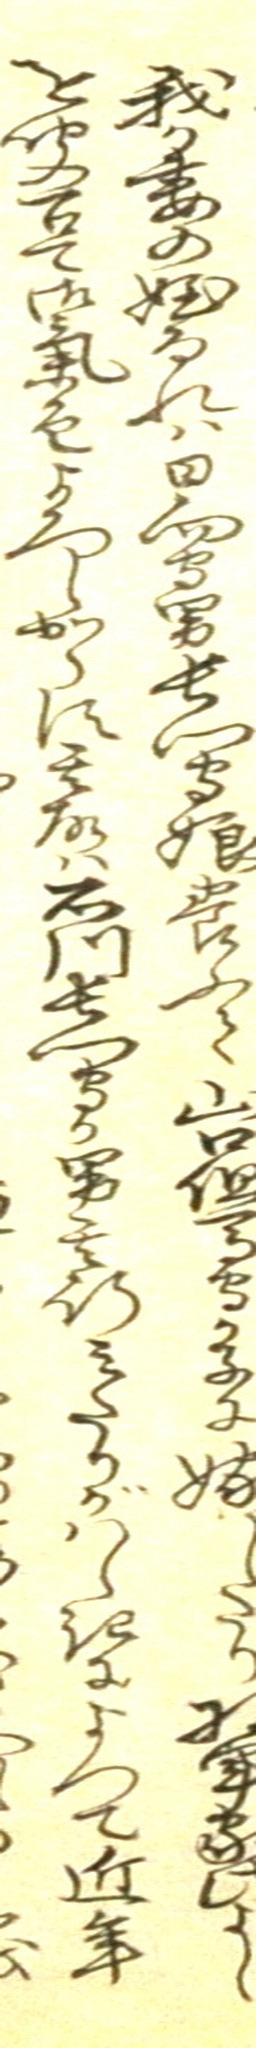を聞召て御気色よろしからす其故は石川長門守か男其行みたりがはしきによつて近年
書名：藩翰譜（四・中）
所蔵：伊那市立高遠町図書館・合同会社AMANE
